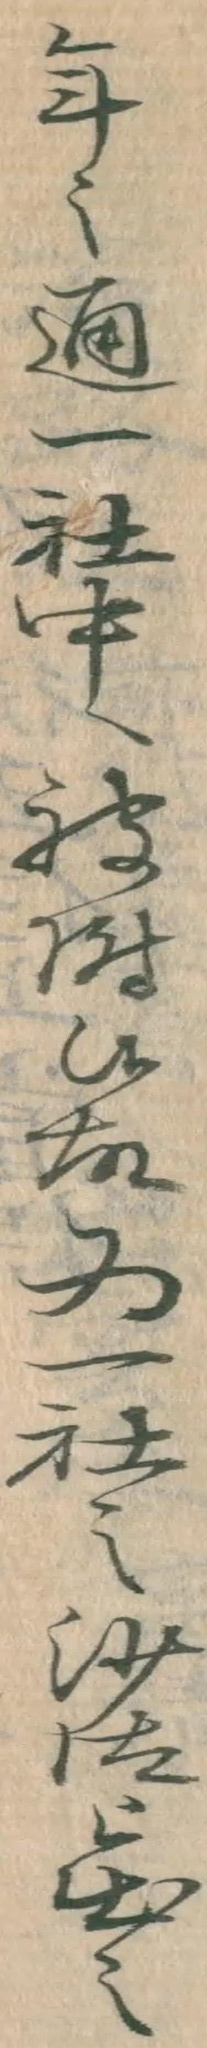年之通一社中へ被附候故為一社之沙汰被出之
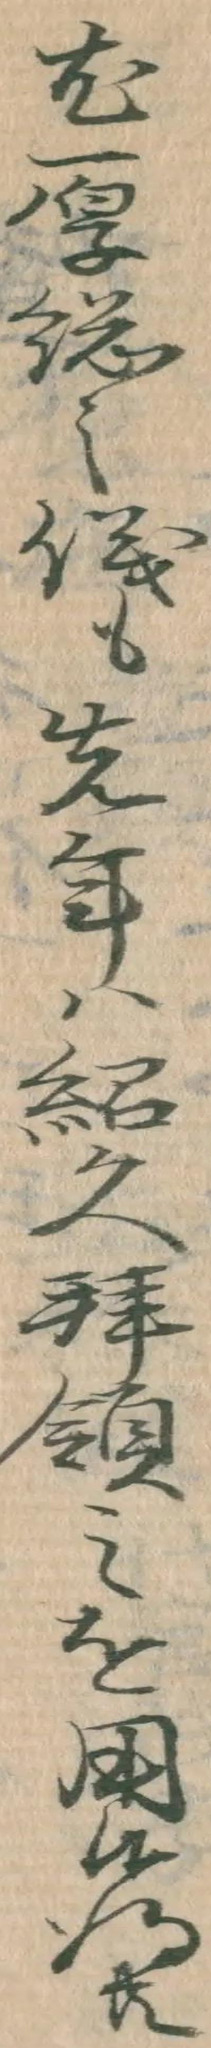尤厚総之儀も先年ハ紹久拝領之を用候得共
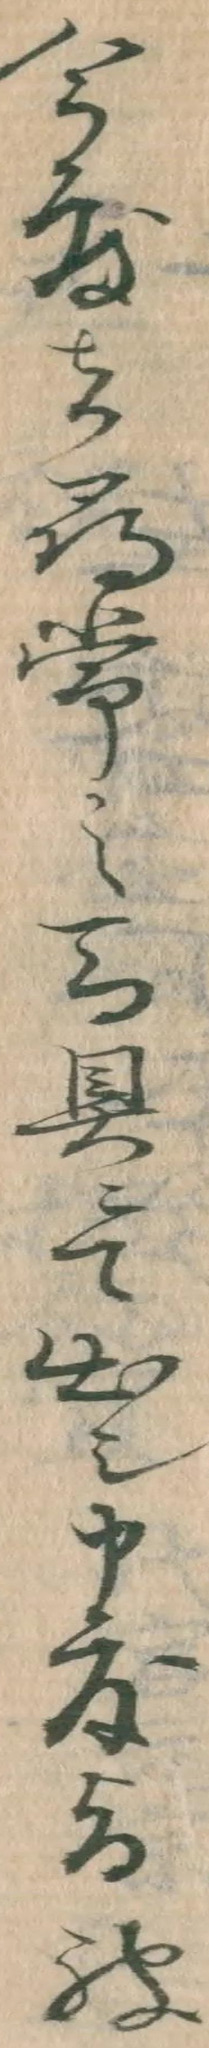今度者尋常之馬具ニて出シ申度旨被
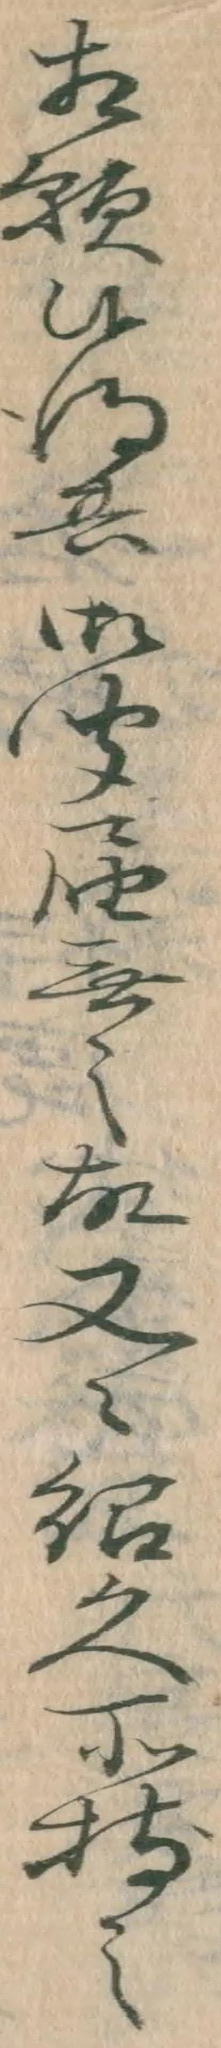相願候得共御聞届無之故又々紹久所持之
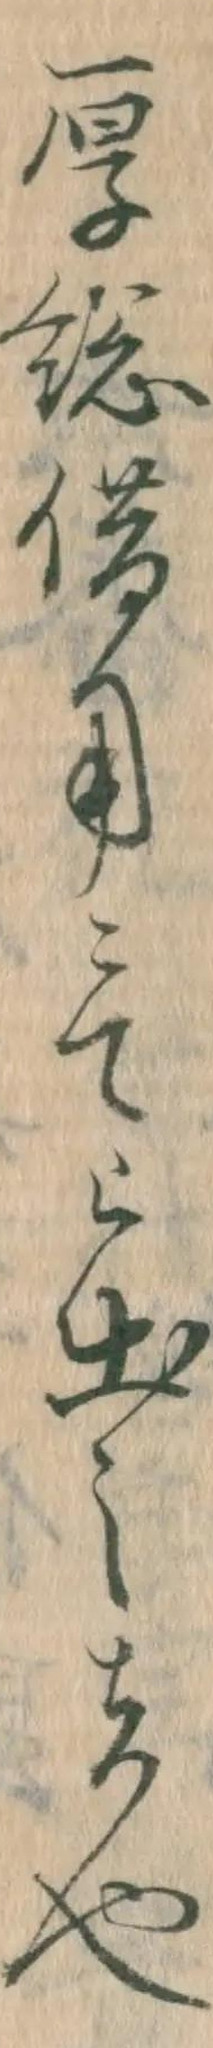厚総借用ニて被出之者也
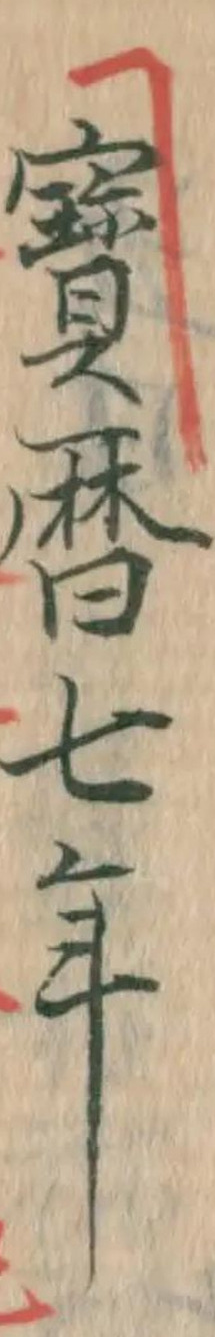宝暦七年
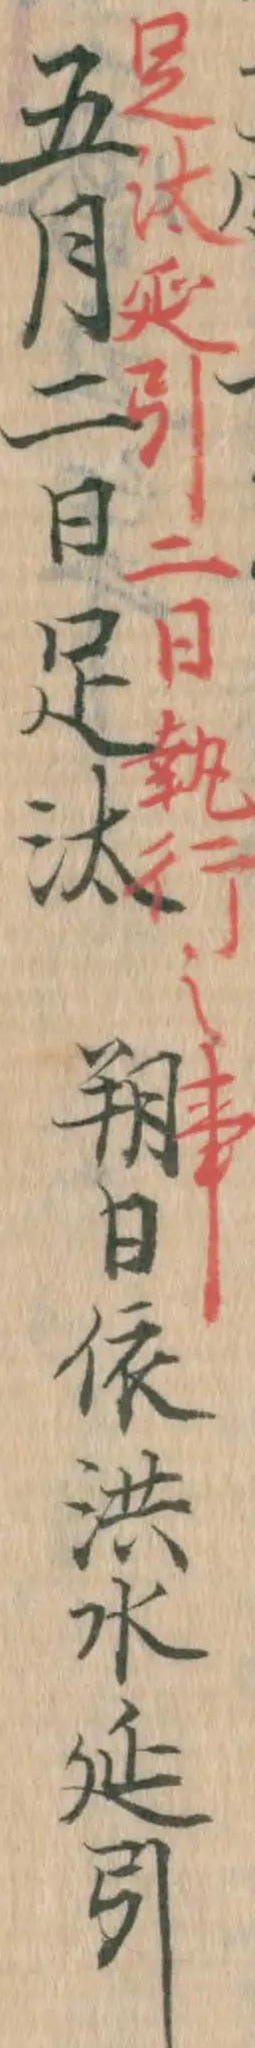五月二日足汰朔日依洪水延引
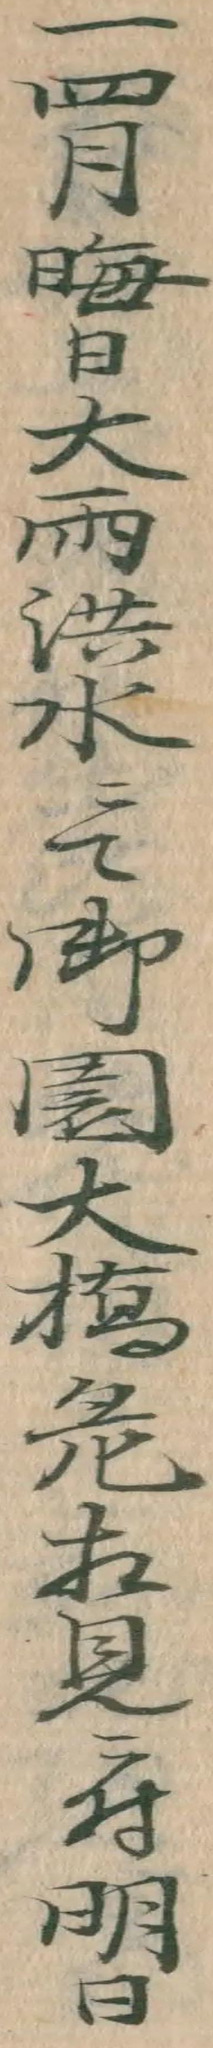一四月晦日大雨洪水ニて御園大橋危相見ニ付明日
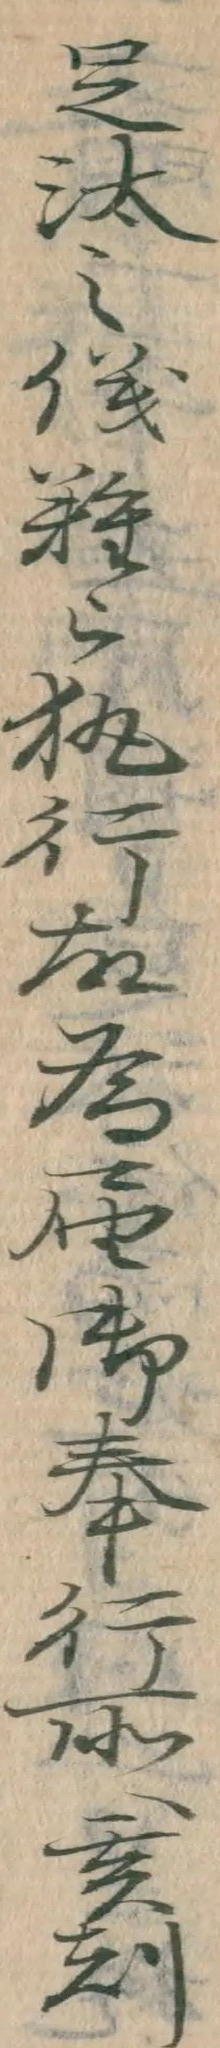足汰之儀難被執行故為届御奉行所へ亥刻
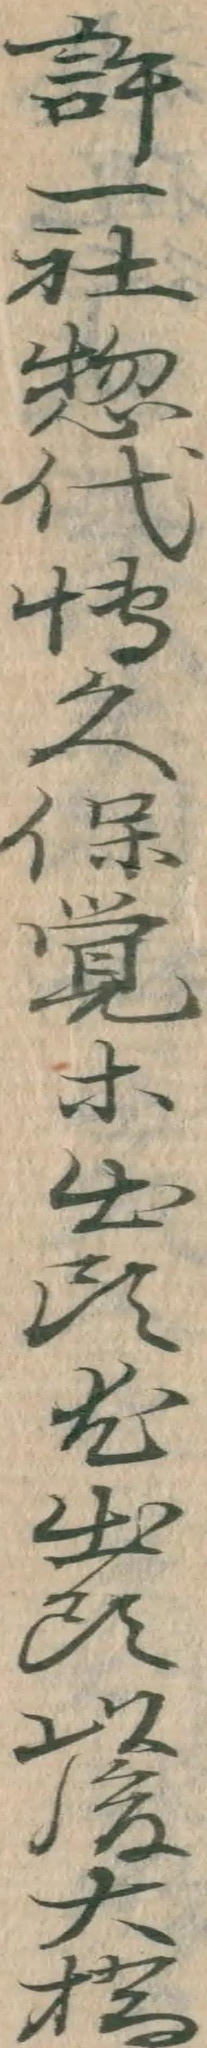許一社惣代博久保覚等出頭尤出頭以後大橋
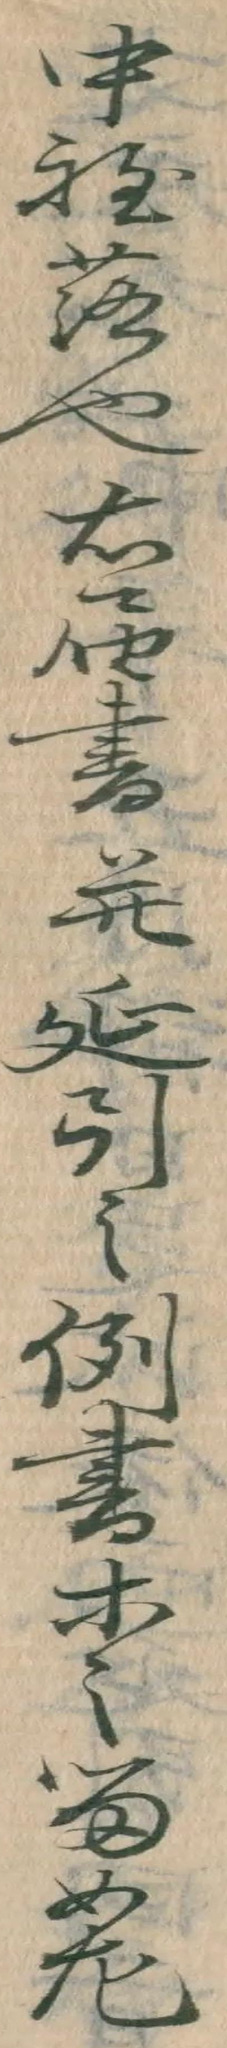中程落也右届書并延引之例書等之留如左
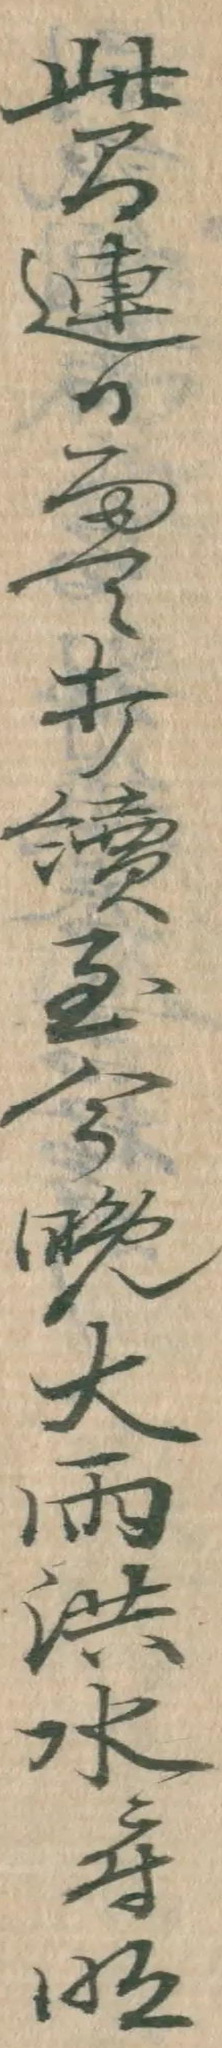此間連日雨て打続至今晩大雨洪水ニ付明
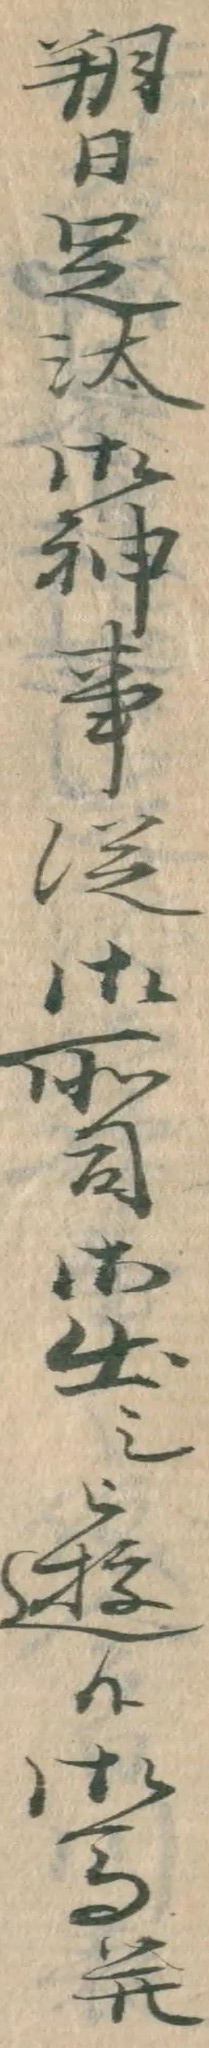朔日足汰御神事従御所司御出シ被遊候御馬并
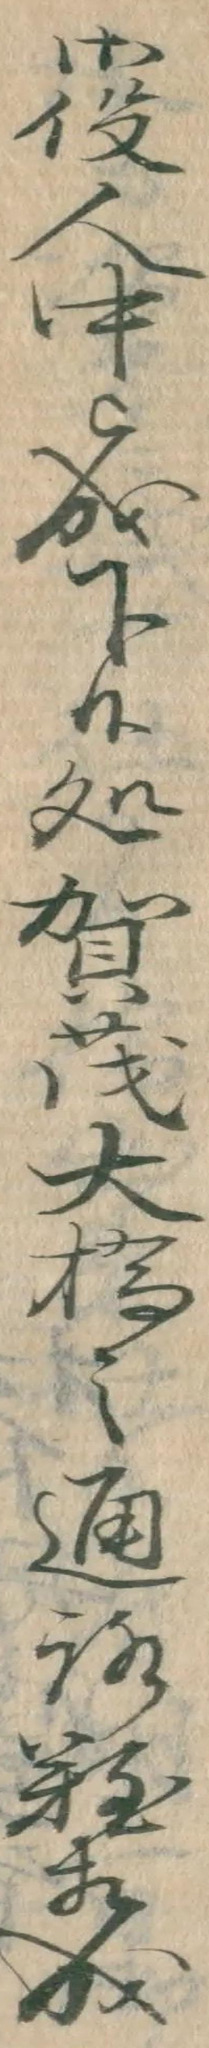御役人中被成下候処賀茂大橋之通路難相成
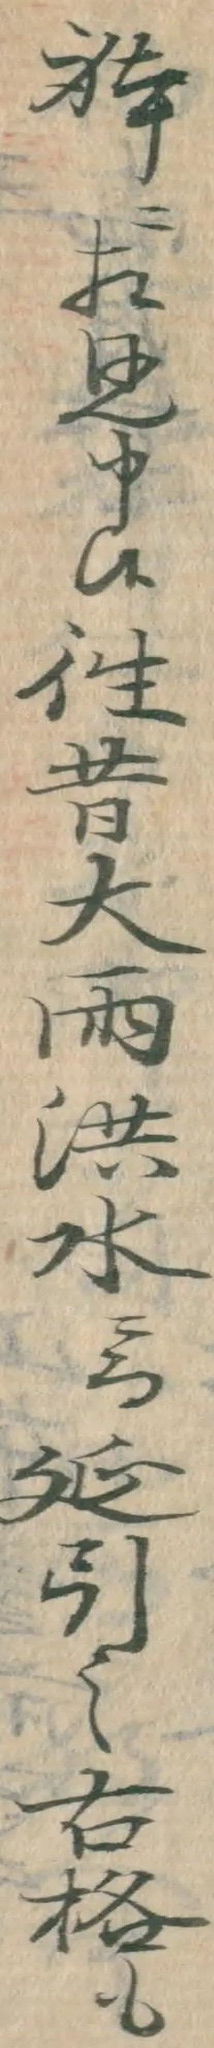体ニ相見申候往昔大雨洪水ニ而延引之古格も
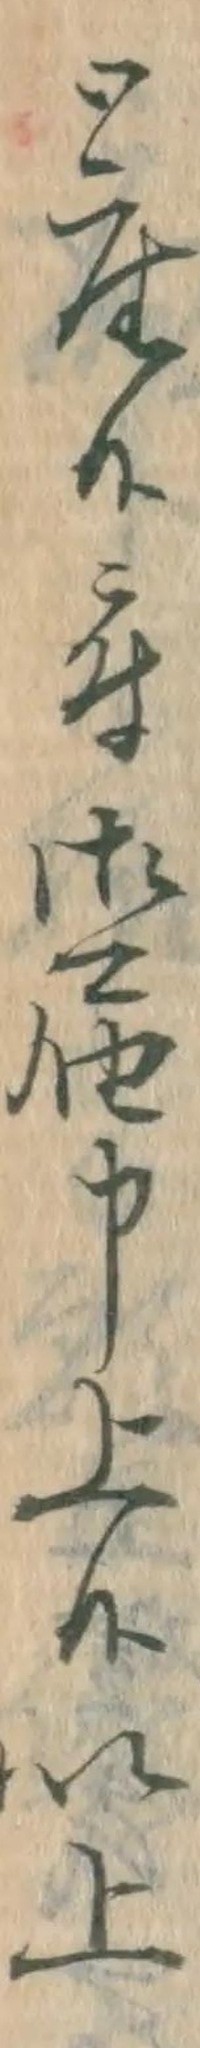御座候ニ付御届申上候以上
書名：賀茂社記録. 第10冊
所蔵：国立国会図書館 National Diet Library, JAPAN
